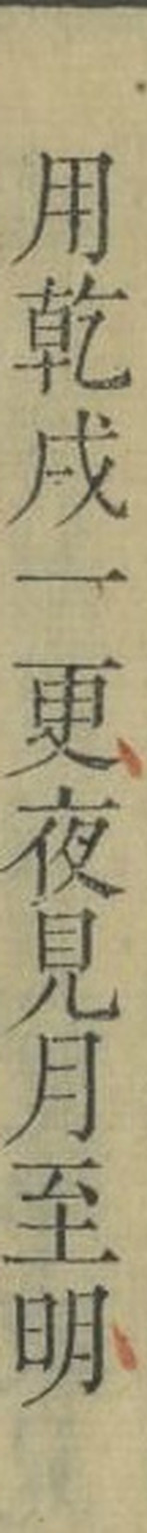用乾戌一更夜見月至明
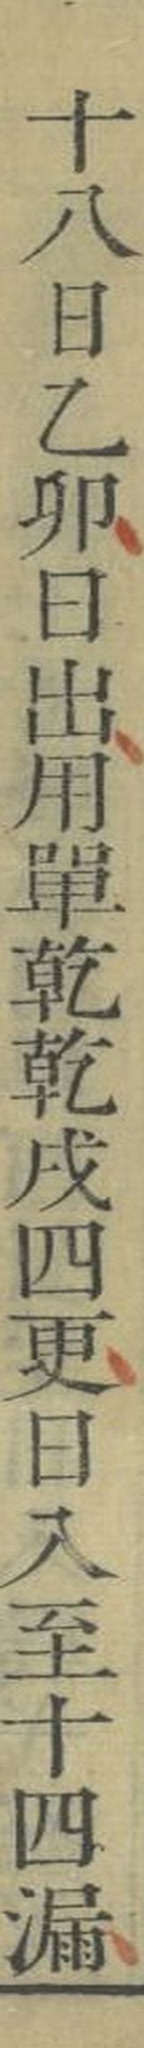十八日乙卯日出用單乾乾戌四更日入至十四漏
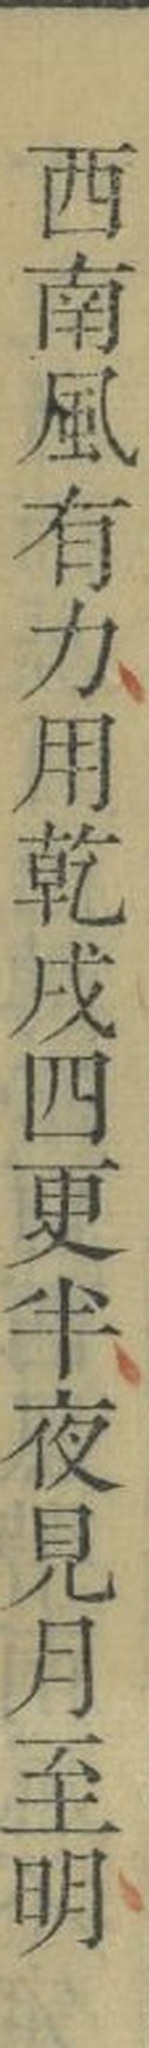西南風有力用乾戌四更半夜見月至明

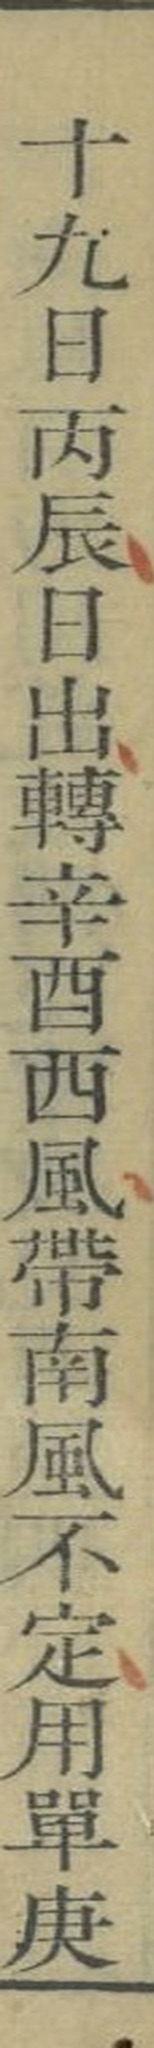十九日丙辰日出轉辛酉西風帶南風不定用單庚
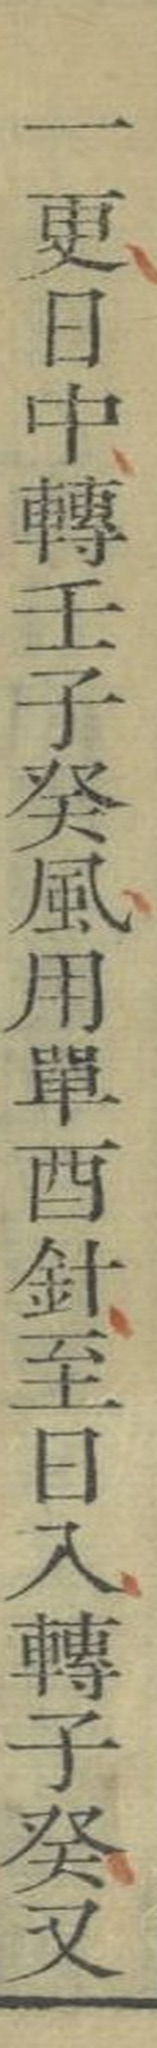一更日中轉壬子癸風用單酉針至日入轉子癸又
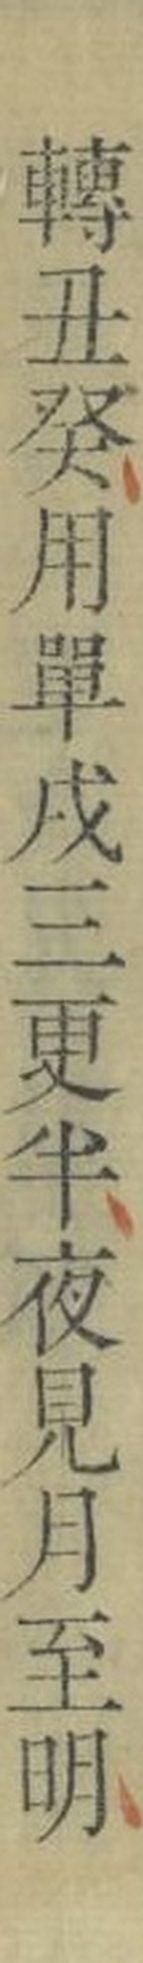轉丑癸用單戌三更半夜見月至明
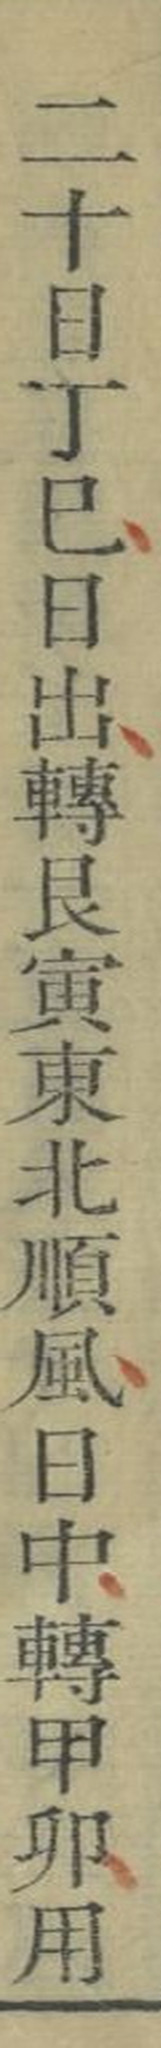二十日丁巳日出轉艮寅東北順風日中轉甲卯用
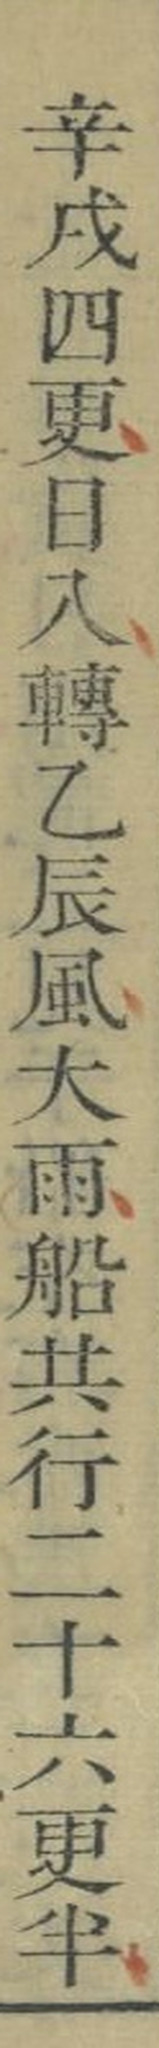辛戌四更日入轉乙辰風大雨船共行二十六更半
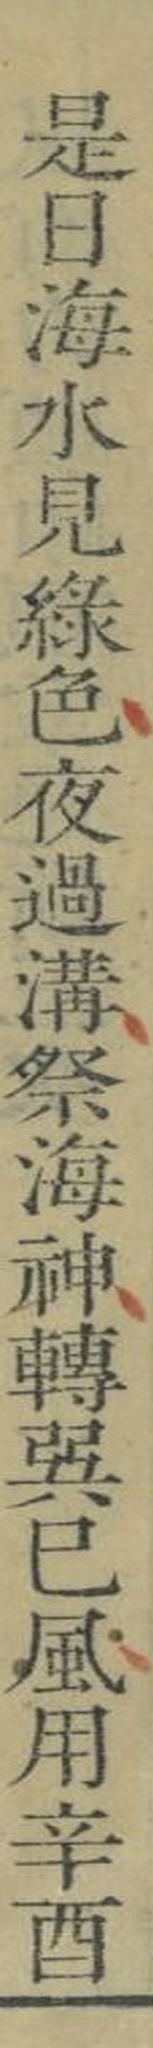是日海水見綠色夜過溝祭海神轉㢲巳風用辛酉
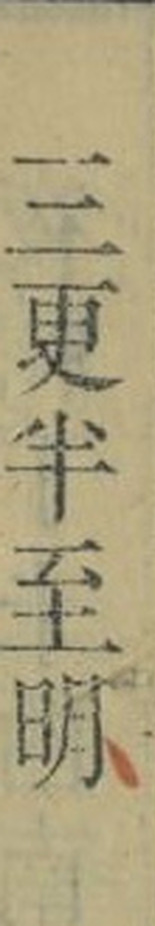三更半至明
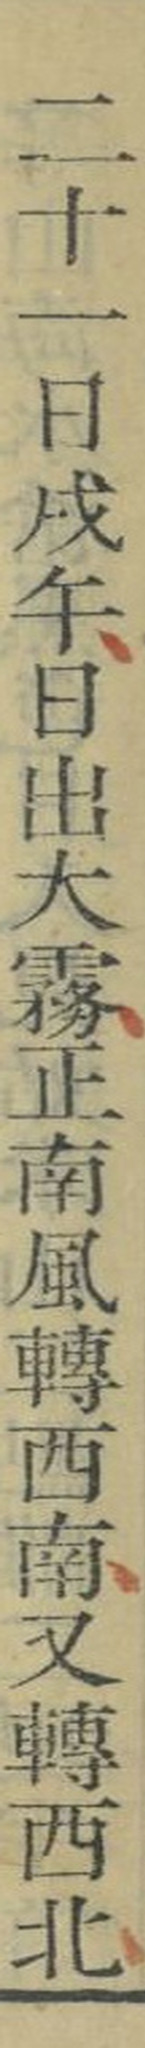二十一日戌午日出大霧正南風轉西南又轉西北
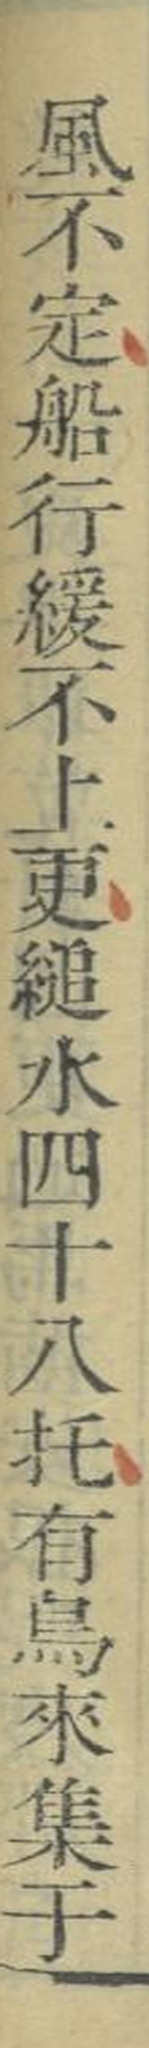風不定船行緩不上更縋水四十八托有鳥來集于
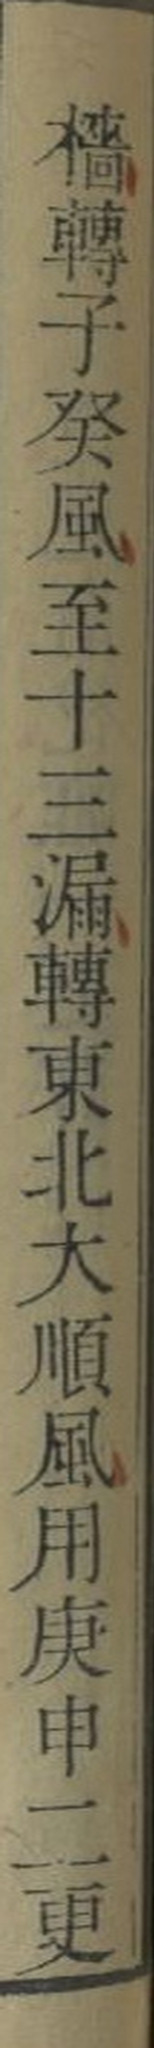檣轉子癸風至十三漏轉東北大順風用庚申二更
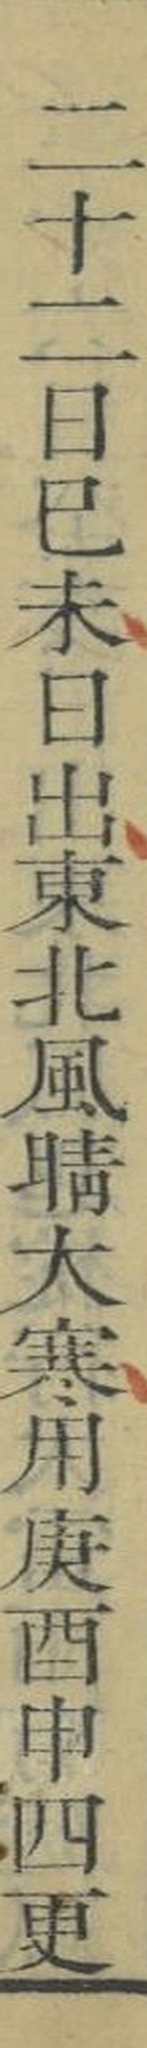二十二日巳未日出東北風晴大寒用庚酉申四更
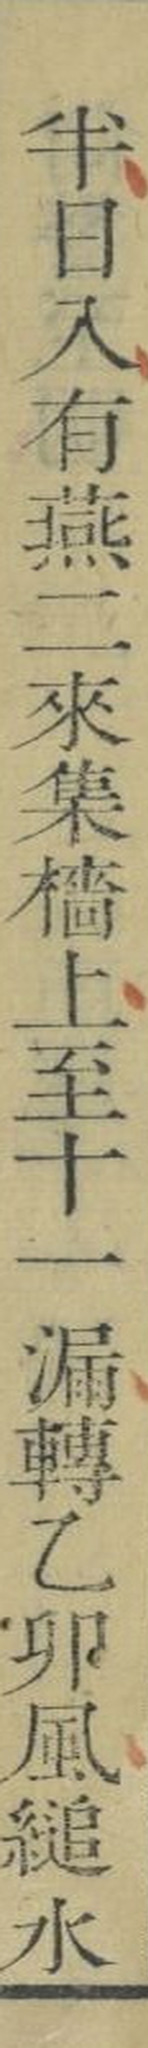半日入有燕二來集檣上至十一漏轉乙卯風縋水
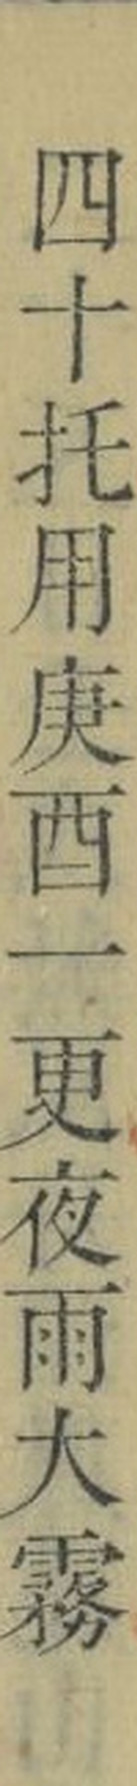四十托用庚酉一更夜雨大霧
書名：中山伝信録 巻一、巻二
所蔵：University of the Ryukyus Library
